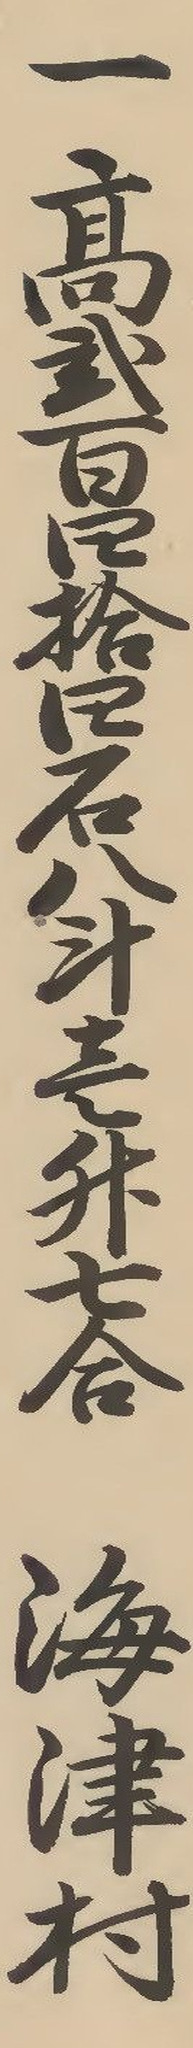一高弐百四拾四石八斗壱升七合海津村
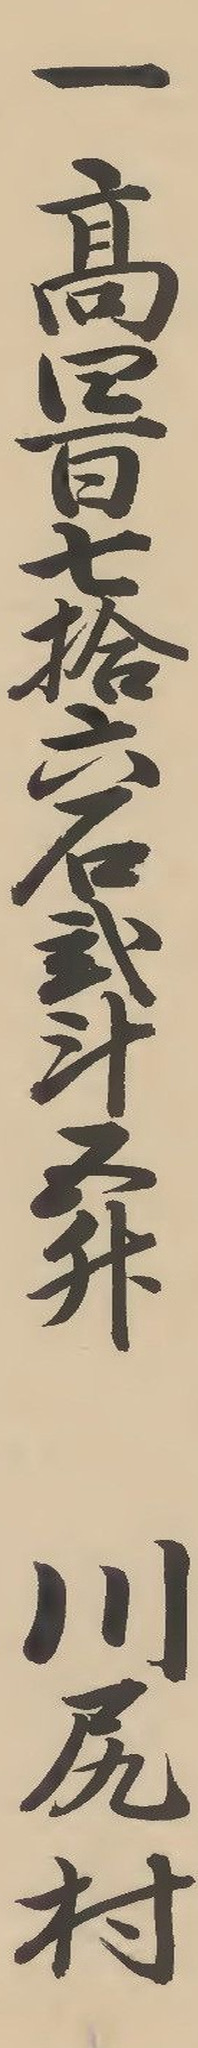一高四百七拾六石弐斗五升川尻村
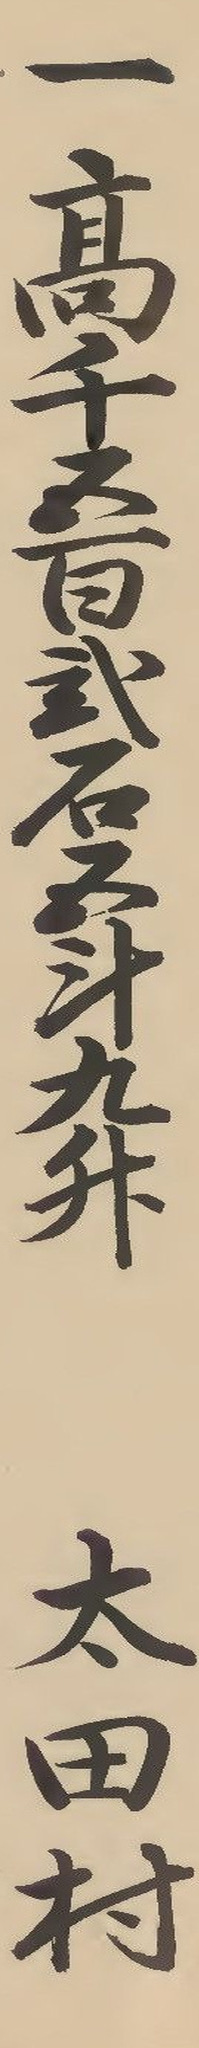一高千五百弐石五斗九升太田村

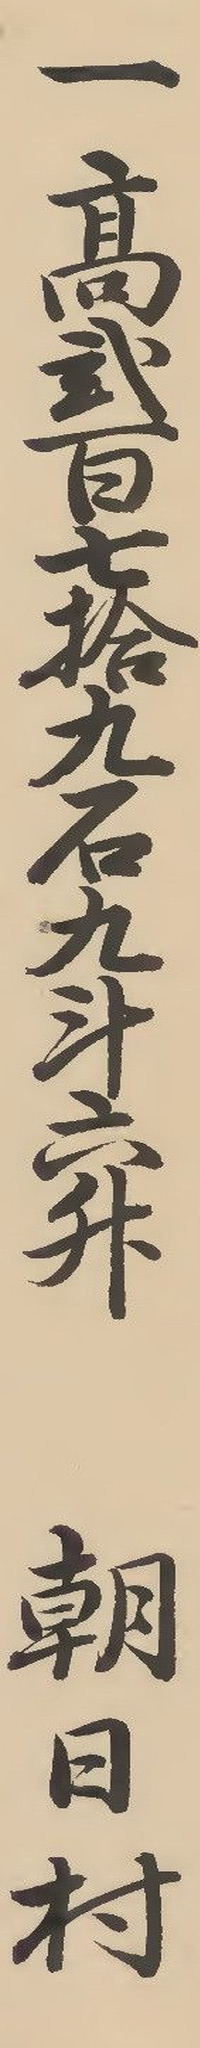一高弐百七拾九石九斗六升朝日村
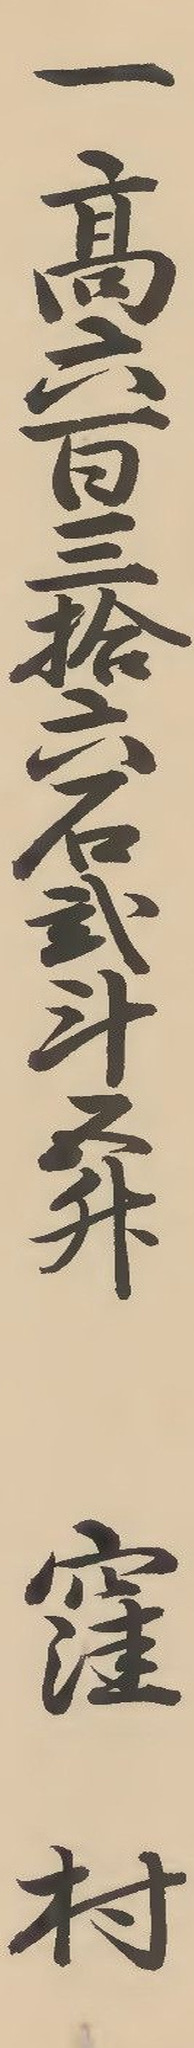一高六百三拾六石弐斗五升窪村
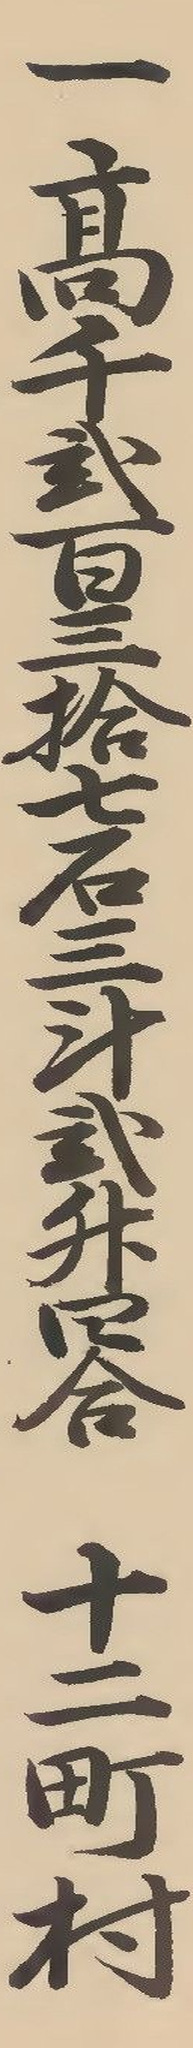一高千弐百三拾七石三斗弐升四合十二町村
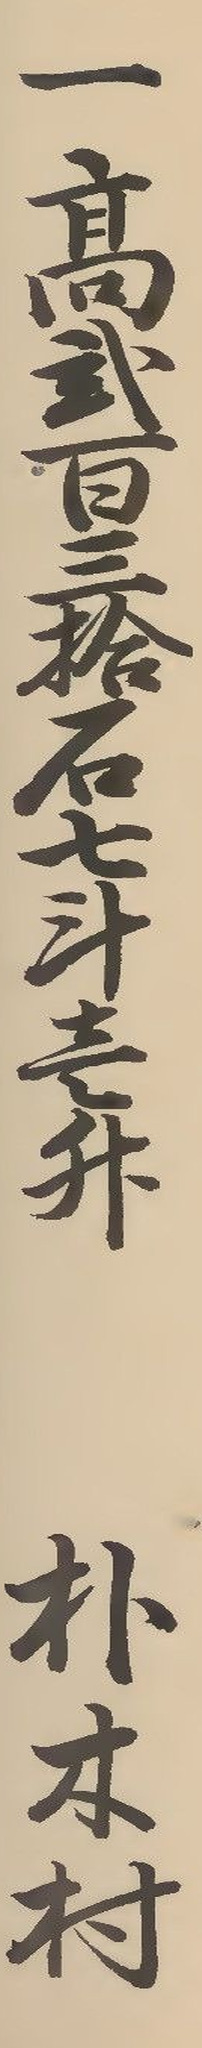一高弐百三拾石七斗壱升朴木村
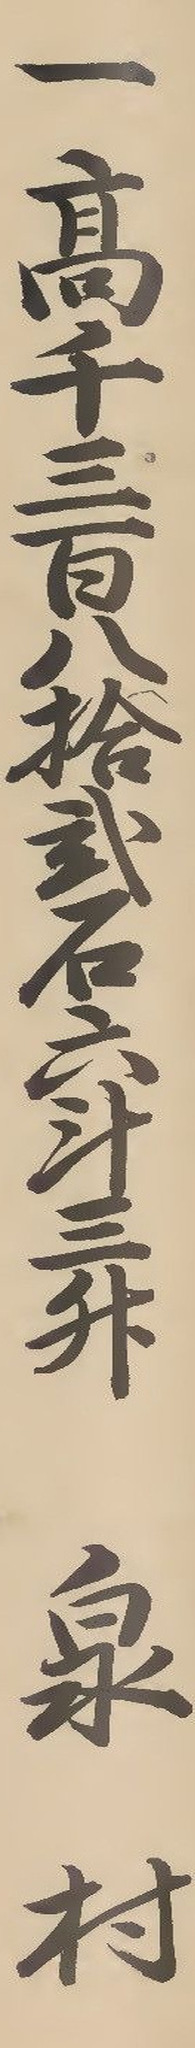一高千三百八拾弐石六斗三升泉村
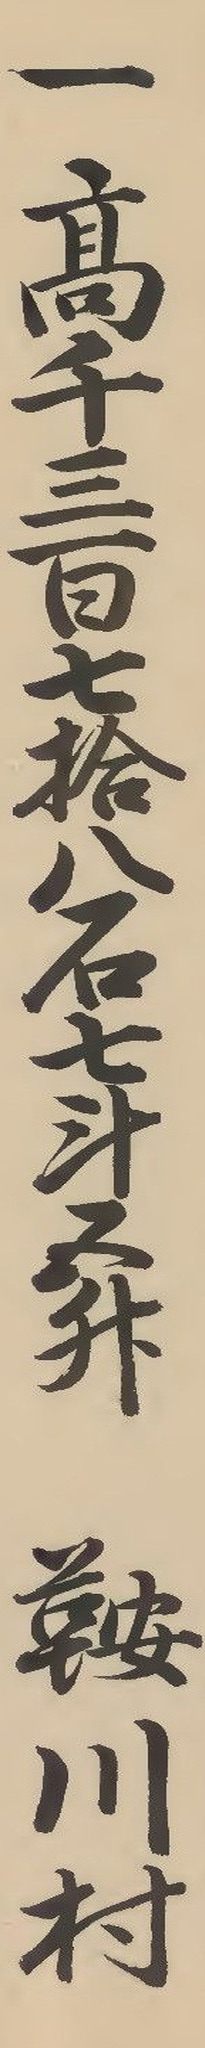一高千三百七拾八石七斗五升鞍川村
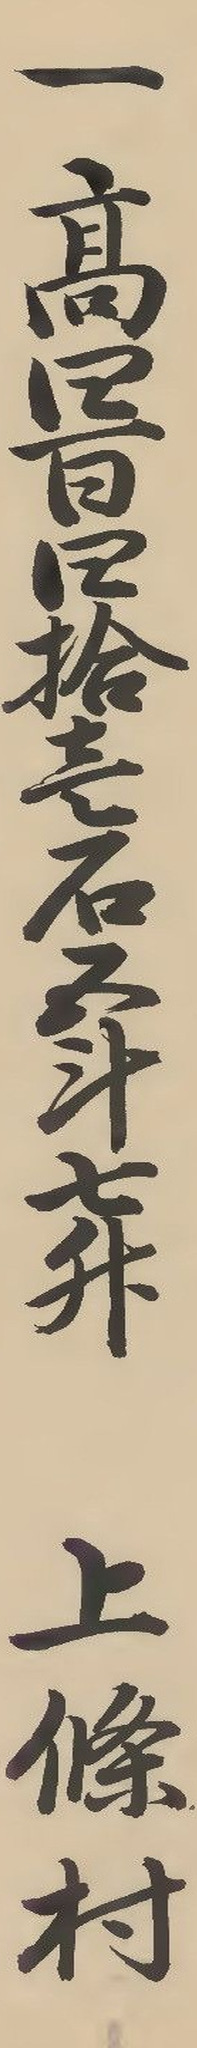一高四百四拾壱石五斗七升上条村

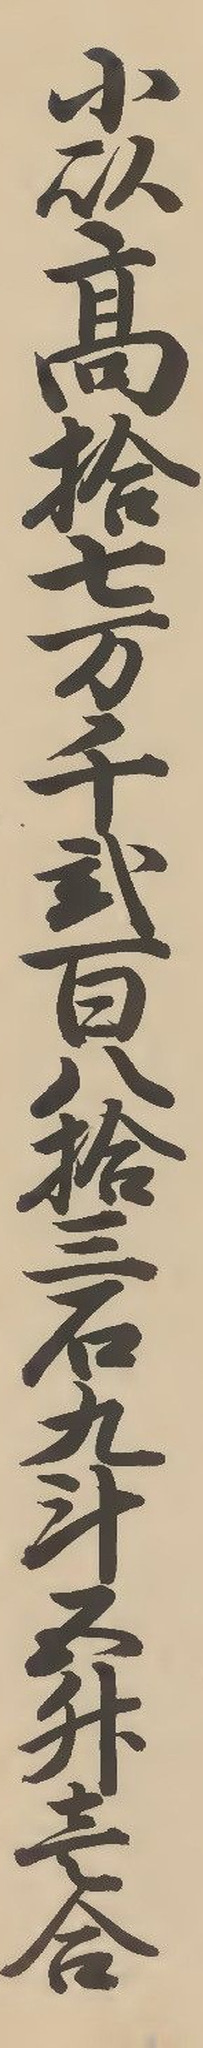小以高拾七万千弐百八拾三石九斗五升壱合
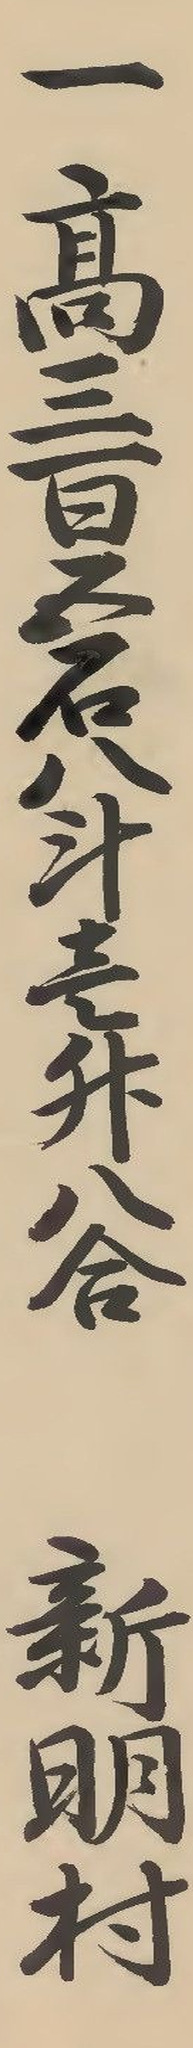一高三百五石八斗壱升八合新明村
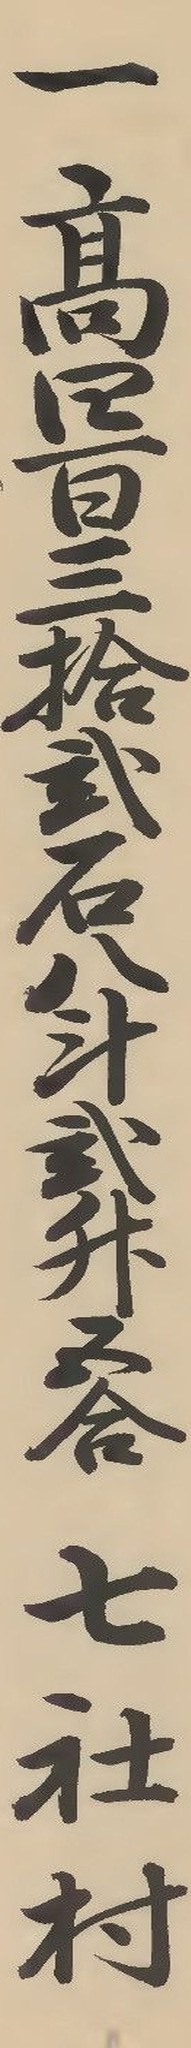一高四百三拾弐石八斗弐升五合七社村
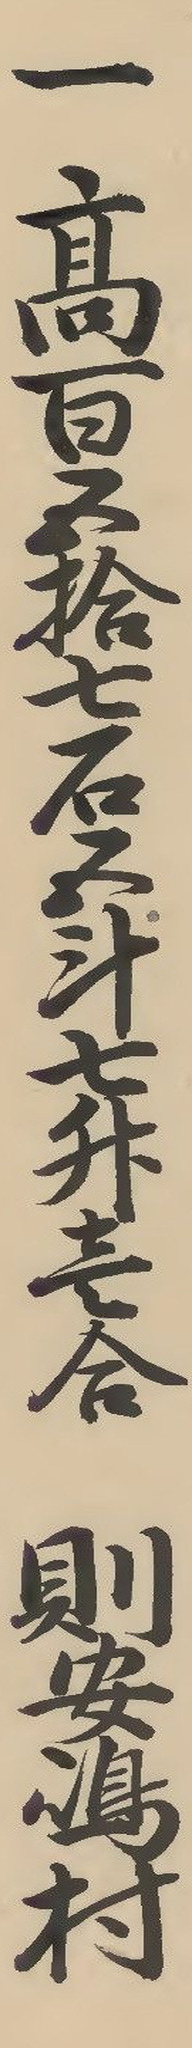一高百五拾七石五斗七升壱合則安島村

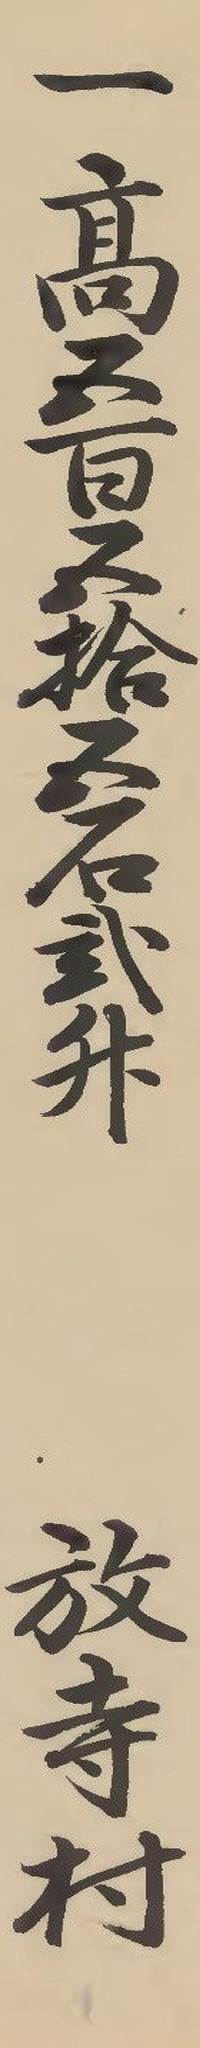一高五百五拾五石弐升放寺村
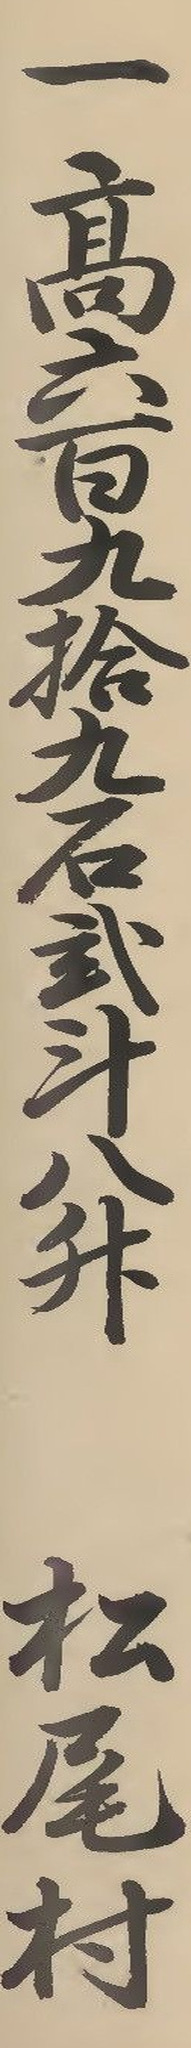一高六百九拾九石弐斗八升松尾村
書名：越中国郷帳
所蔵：国立公文書館 National Archives of Japan
